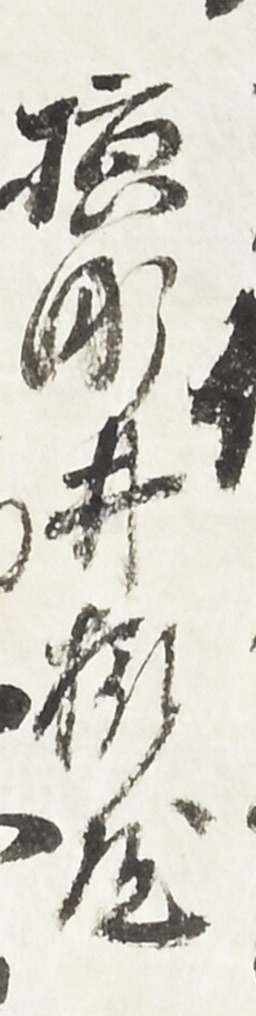横町井桁屋
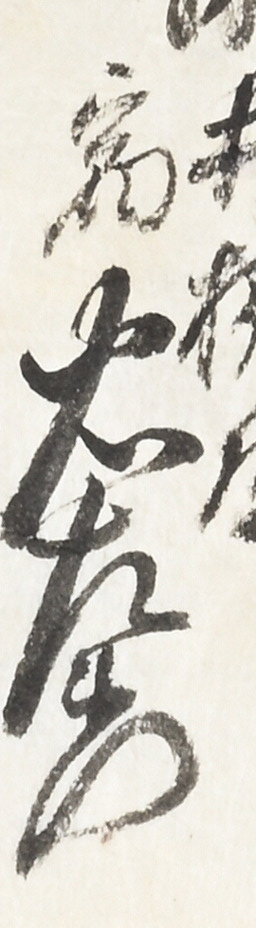宿忠左衛門
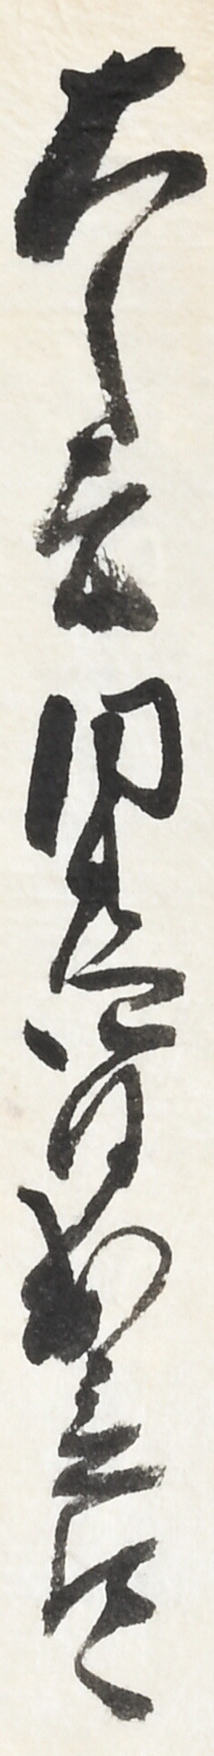右之者同廿四日出立仕候
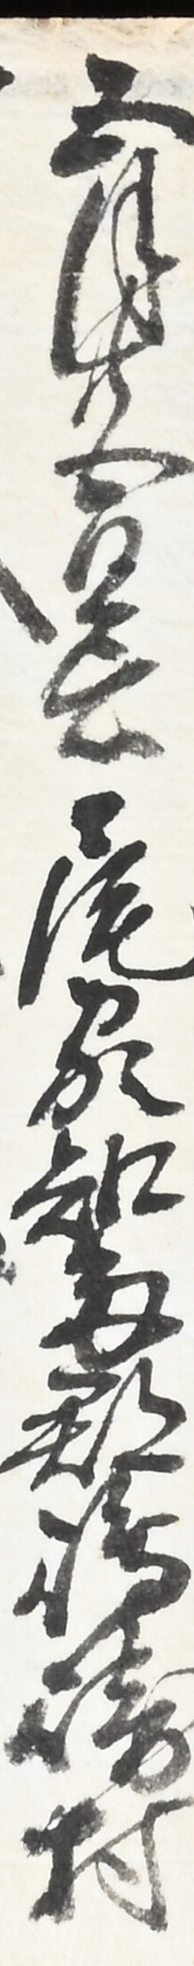五月廿五日着尾州知多郡嶋崎村
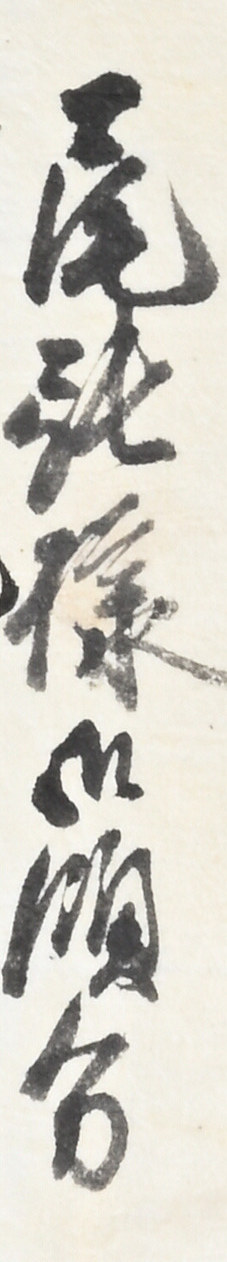尾張様御領分
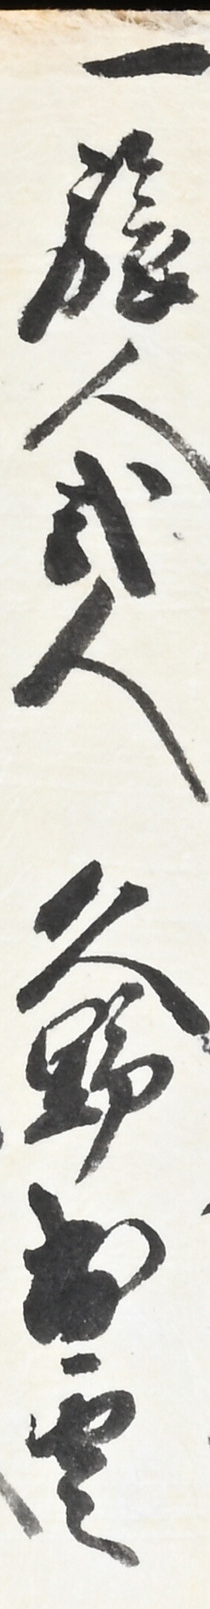一旅人弐人久野出雲
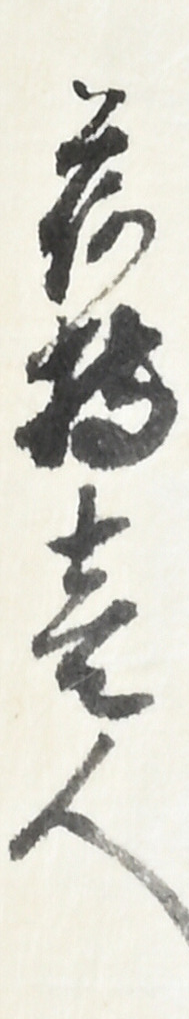荷持壱人
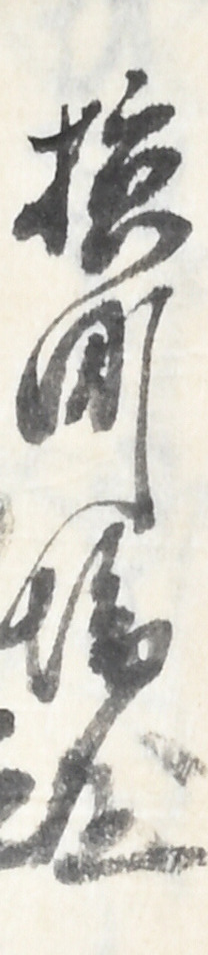横町冨屋
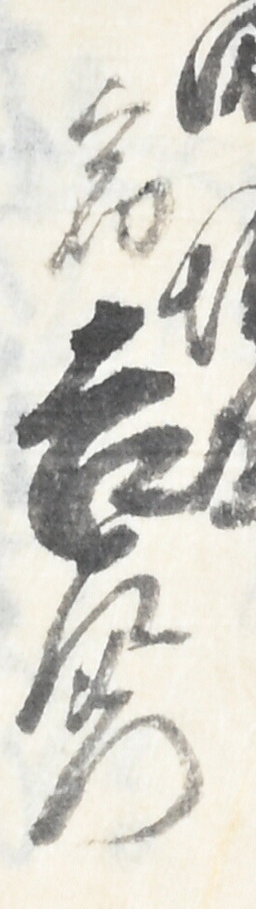宿忠左衛門
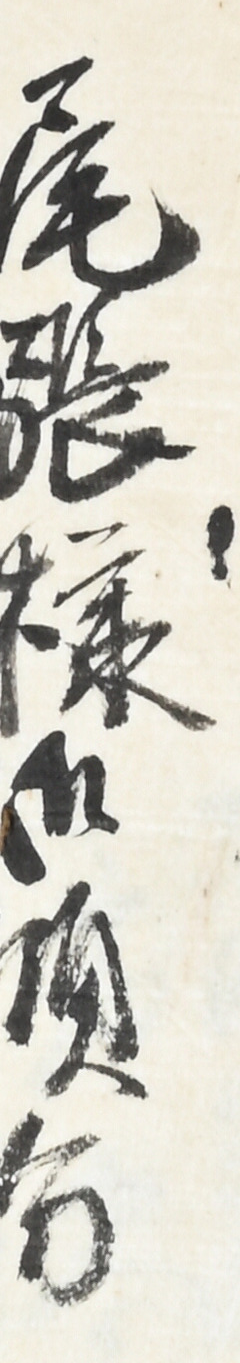尾張様御領分

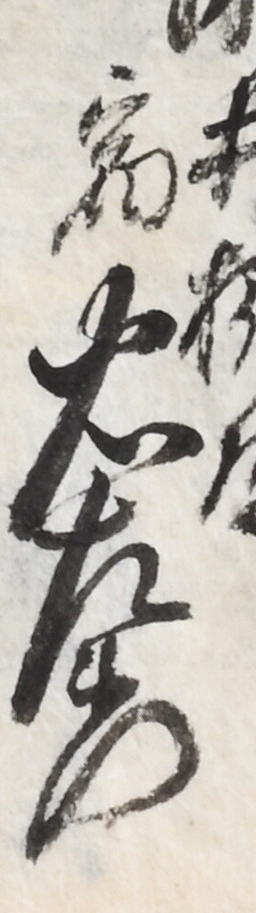宿吉左衛門
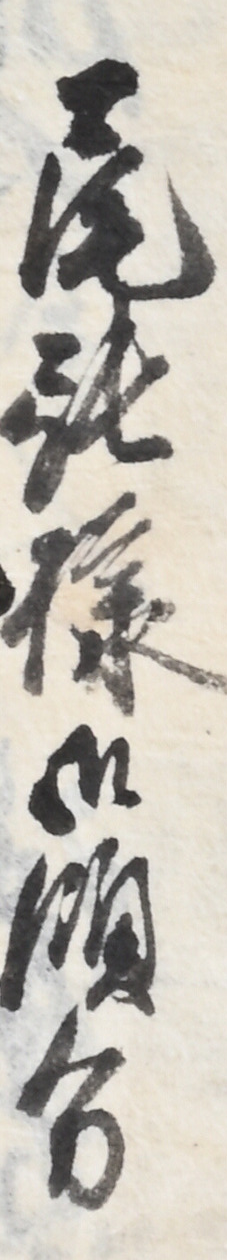尾張様御領分
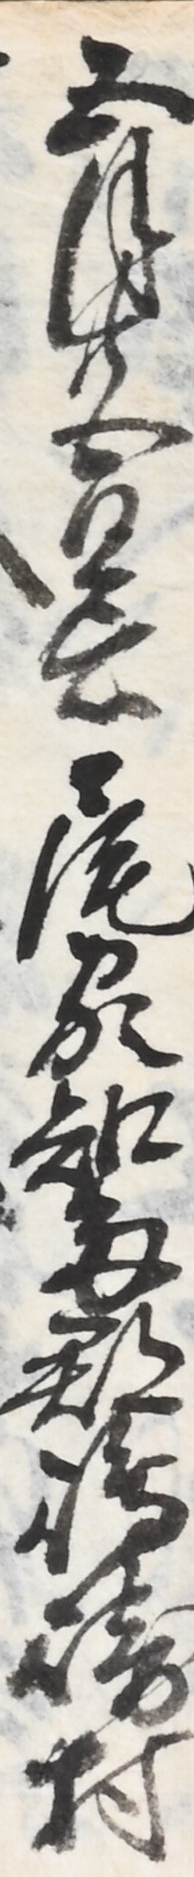五月廿五日尾州知多郡嶋崎村
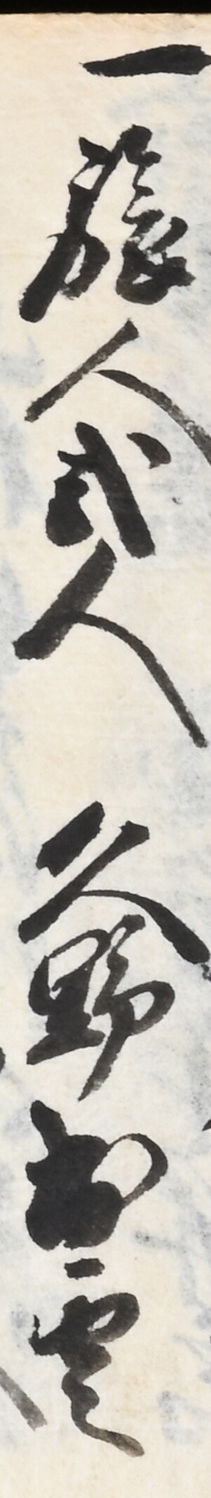一旅人弐人平野左京
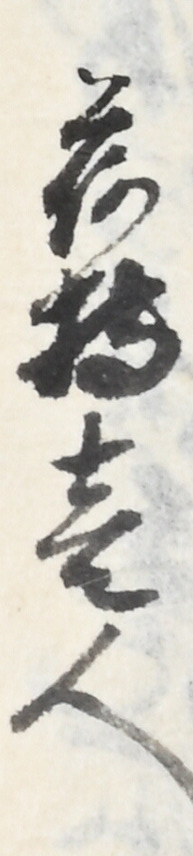荷持壱人
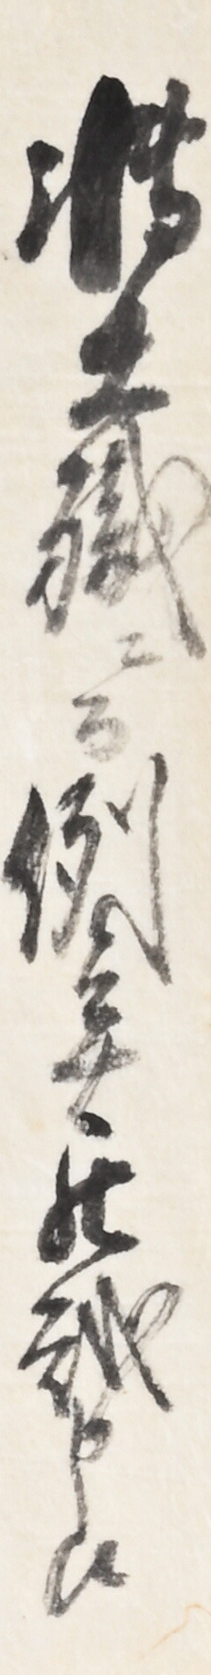転士職ニ而例年罷越申候
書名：旅人泊控帳
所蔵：伊那市立高遠町図書館・合同会社AMANE
